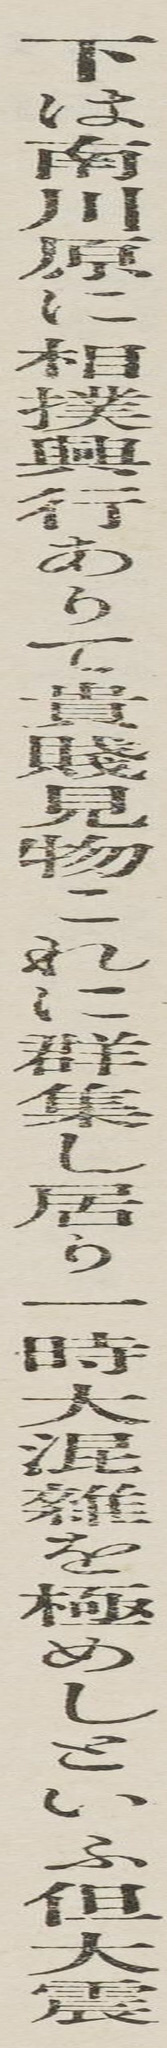下は南川原に相撲興行ありて貴賤見物これに群集し居り一時大混雑を極めしといふ但大震
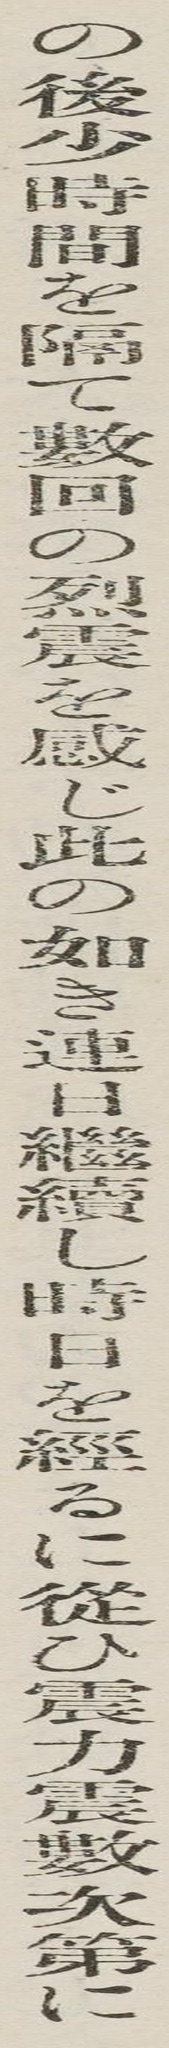の後少時間を隔て数回の烈震を感じ此の如き連日継続し時日を経るに従ひ震力震数次第に
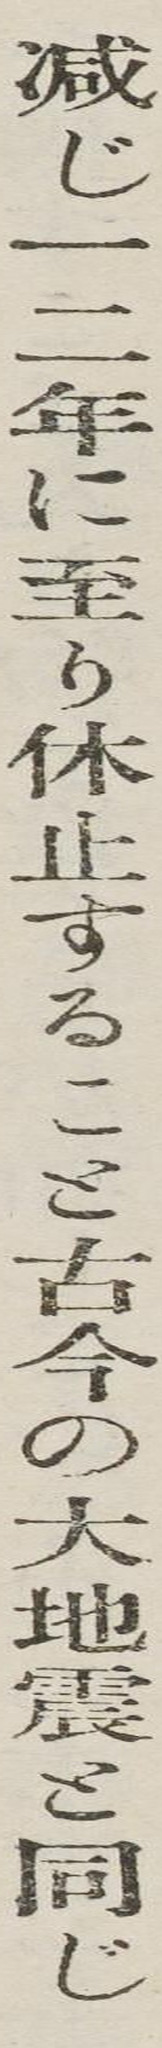減じ一二年に至り休止すること古今の大地震と同じ

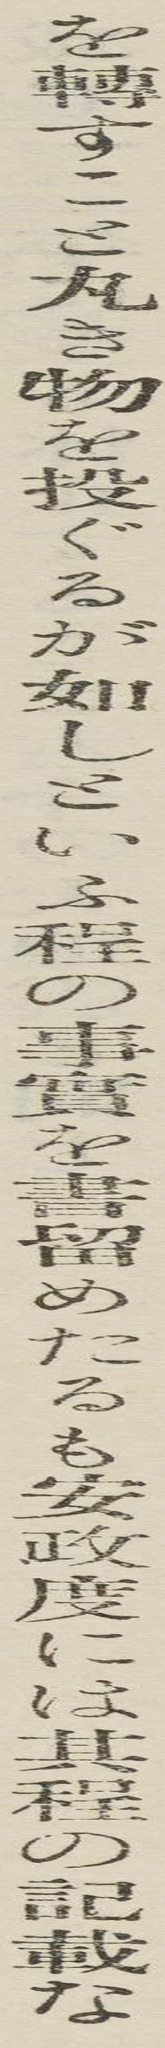を転すこと丸き物を投ぐるが如しといふ程の事実を書留めたるも安政度には其程の記載な
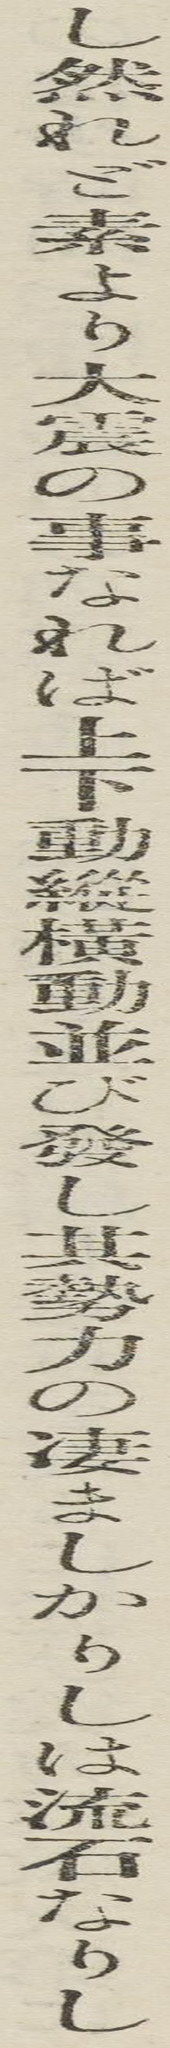し然れど素より大震の事なれば上下動縦横動並び発し其勢力の凄ましかりしは流石なりし
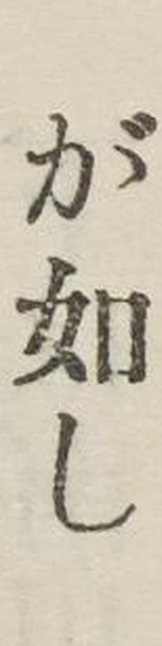が如し
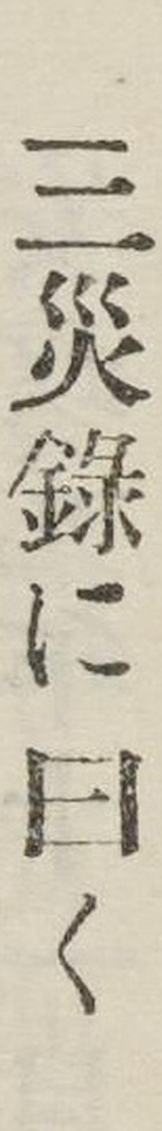三災録に曰く
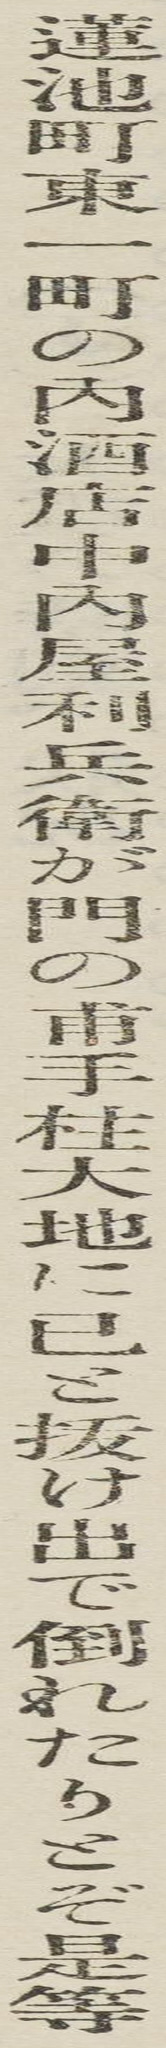蓮池町東一町の内酒店中内屋利兵衛が門の甫手柱大地に已と抜け出で倒れたりとぞ是等
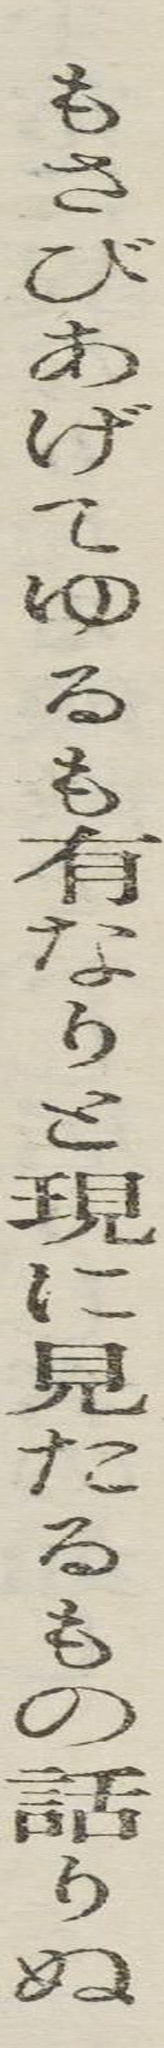もさびあげてゆるも有なりと現に見たるもの話りぬ
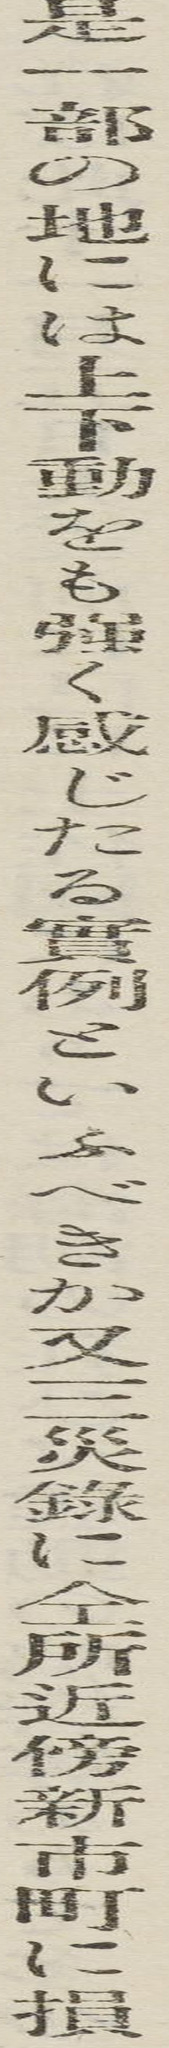是一部の地には上下動をも強く感じたる実例といふべきか又三災録に仝所近傍新市町に損
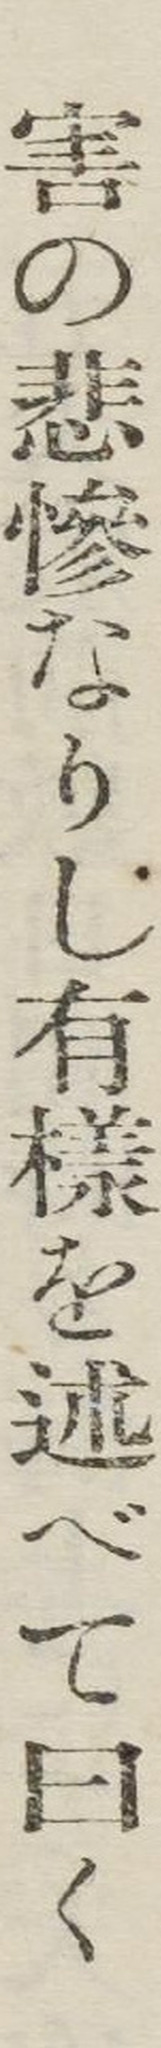害の悲惨なりし有様を述べて曰く
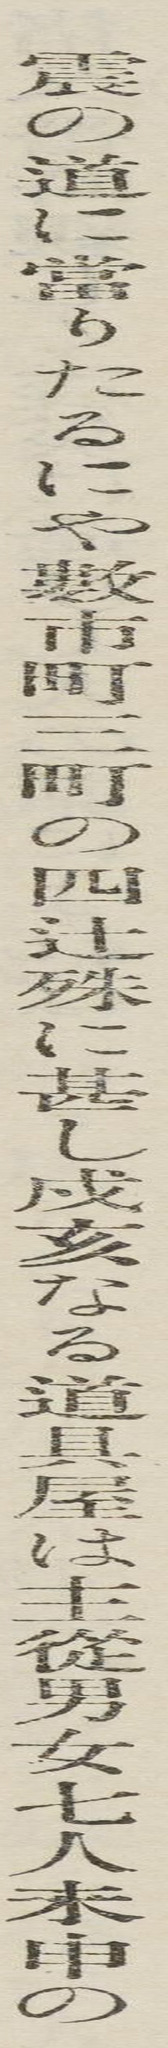震の道に当りたるにや数市町三町の四辻殊に甚し戌亥なる道具屋は主従男女七人未申の
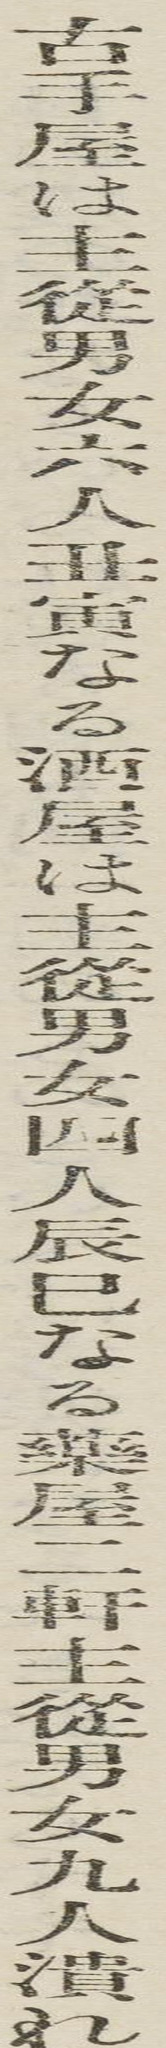古手屋は主従男女六人丑寅なる酒屋は主従男女四人辰巳なる薬屋二軒主従男女九人潰れ
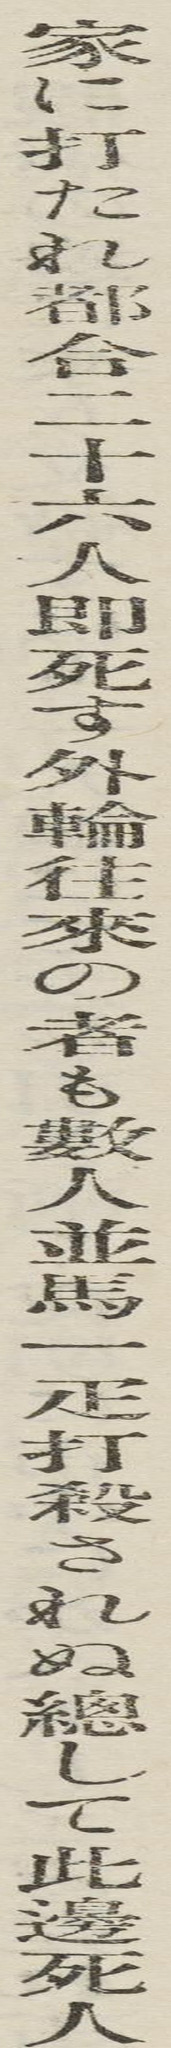家に打たれ都合二十六人即死す外輪往来の者も数人並馬一疋打殺されぬ総して此辺死人
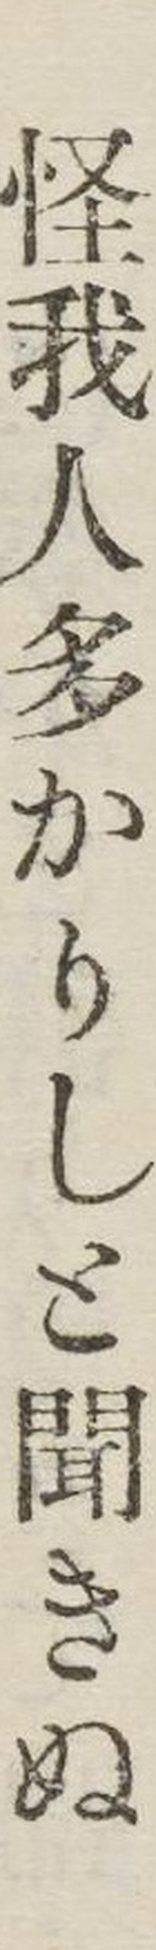怪我人多かりしと聞きぬ
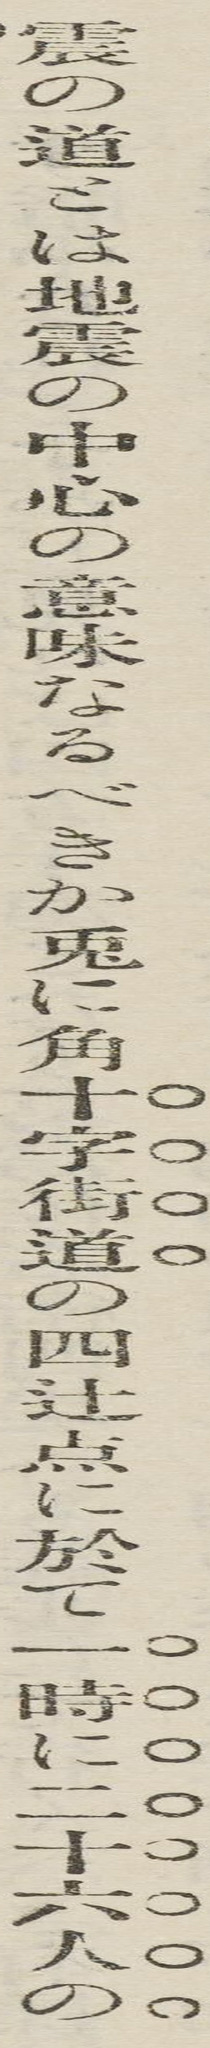震の道とは地震の中心の意味なるべきか兎に角十字街道の四辻点に於て一時に二十六人の
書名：土佐古今ノ地震
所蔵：東京大学地震研究所図書室 Earthquake Research Institute Library, The University of Tokyo, JAPAN
